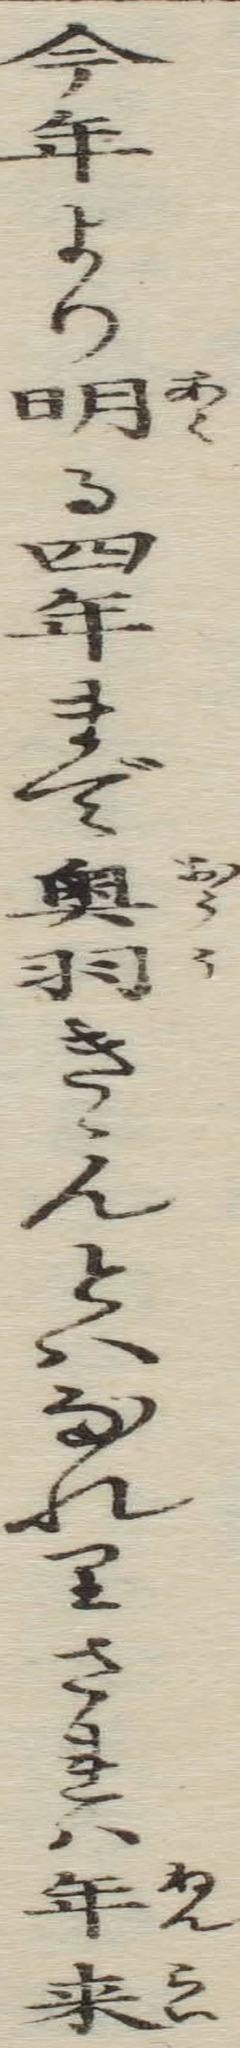今年より明る四年まで奥羽きゝんとはなれりされは年来
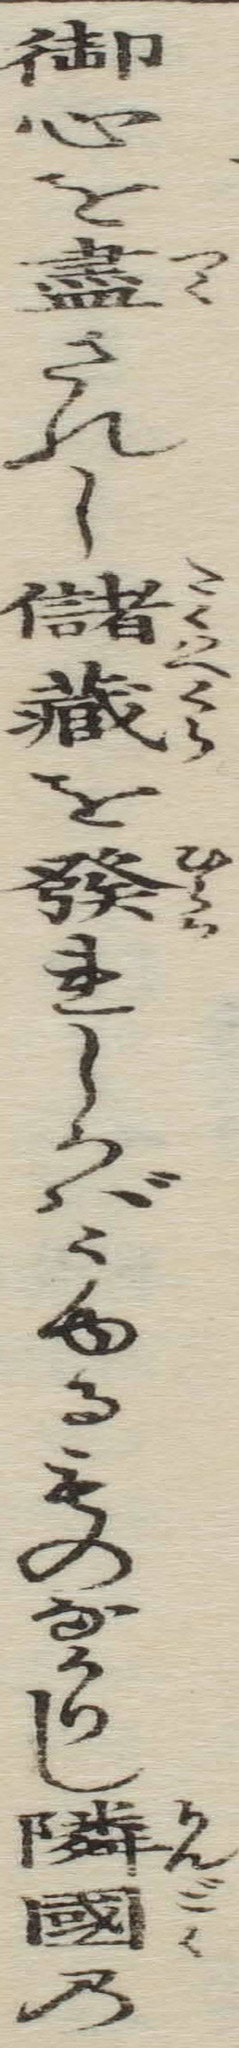御心を尽されし儲蔵を発れしかばうゆるものなかりし隣国の
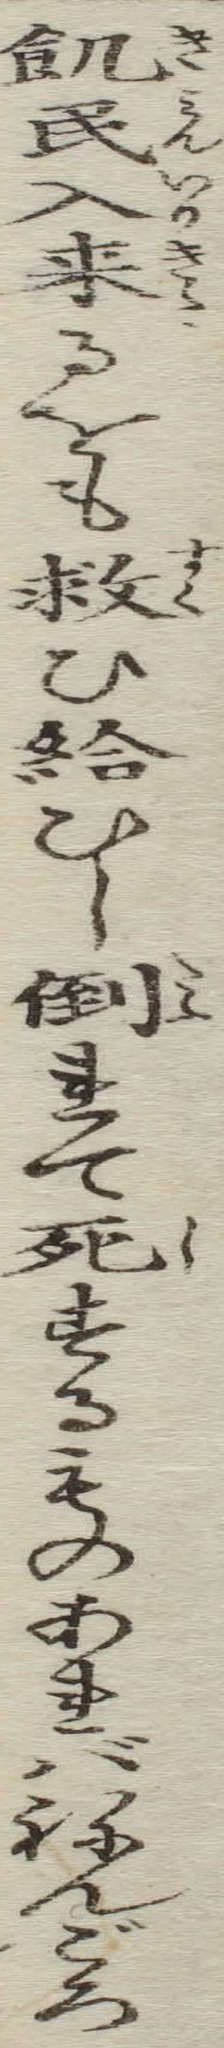飢民入来るをも救ひ給ひし倒れて死するものあればねんごろ
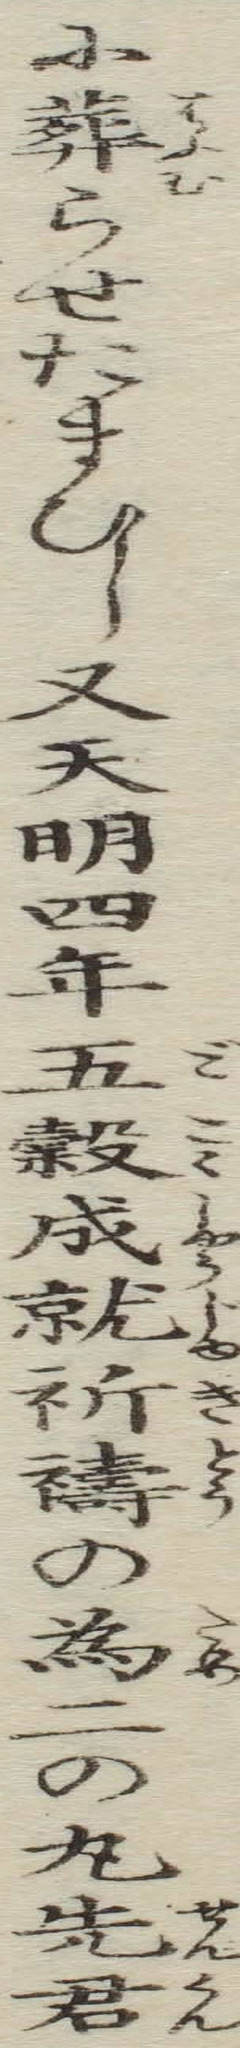に葬らせたまひし又天明四年五穀成就祈祷の為二の丸先君
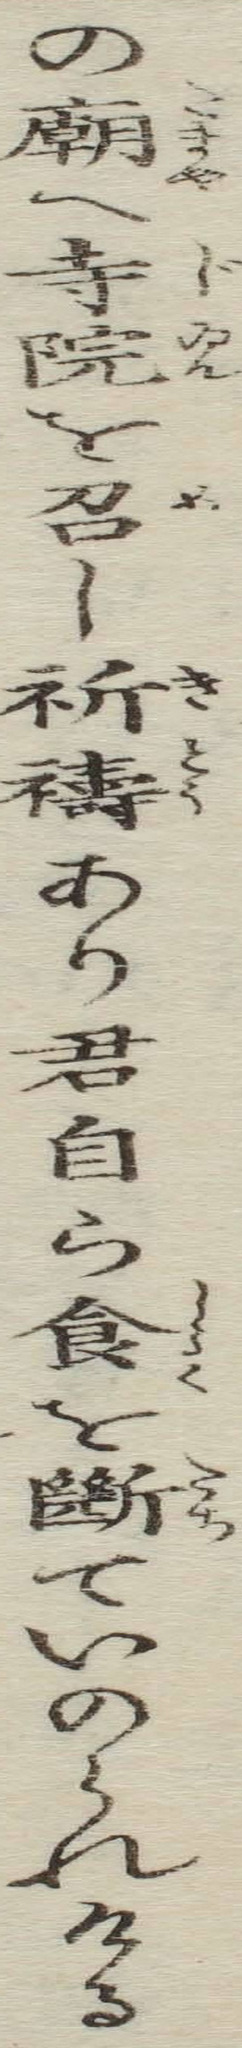の廟へ寺院を召し祈祷あり君自ら食を断ていのられける
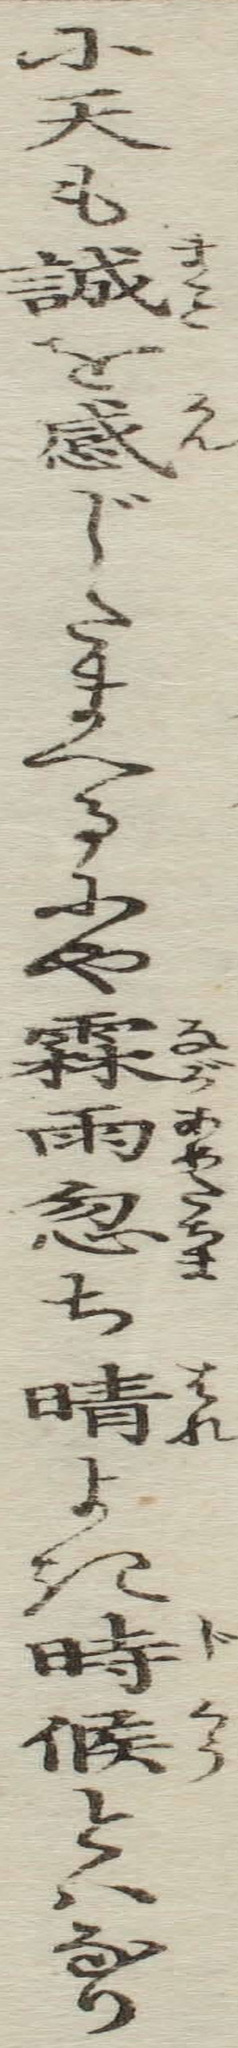に天も誠を感じたまへるにや霖雨忽ち晴よき時候とはなり
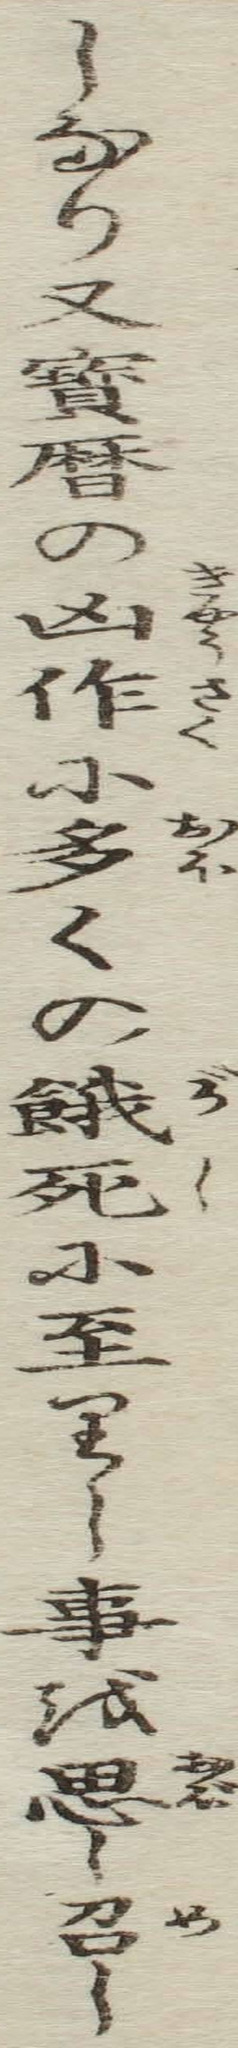しなり又宝暦の凶作に多くの餓死に至りし事を思し召し
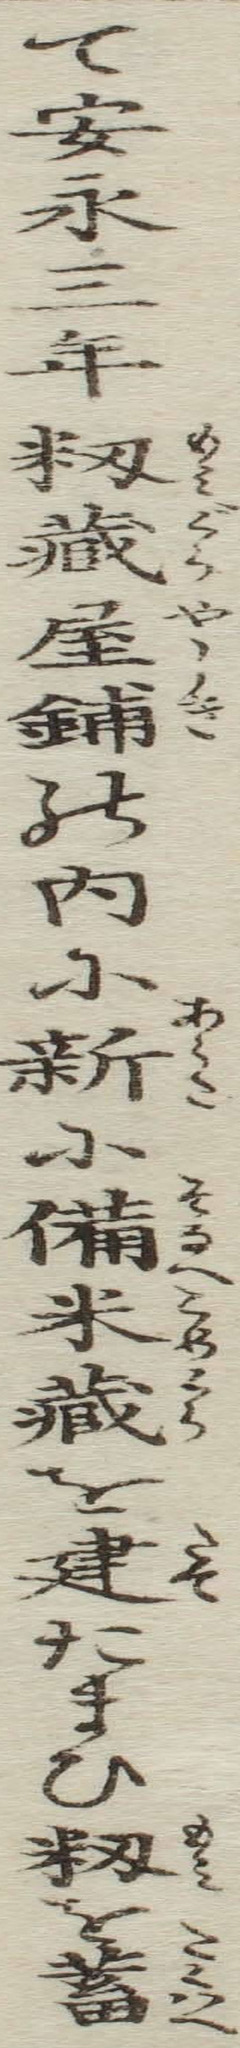て安永三年籾蔵屋鋪の内に新に備米蔵を建たまひ籾を蓄
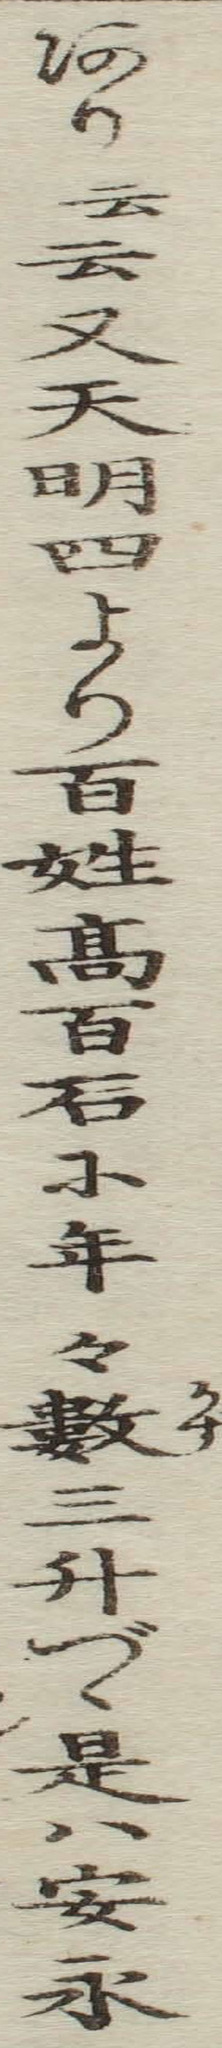あり云云又天明四より百姓高百石に年々数三升づゝ是は安永
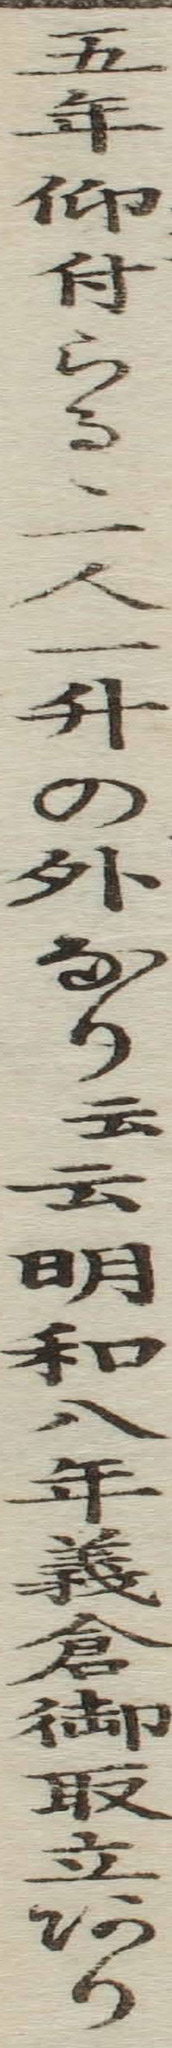五年仰付らるゝ一人一升の外なり云云明和八年義倉御取立あり

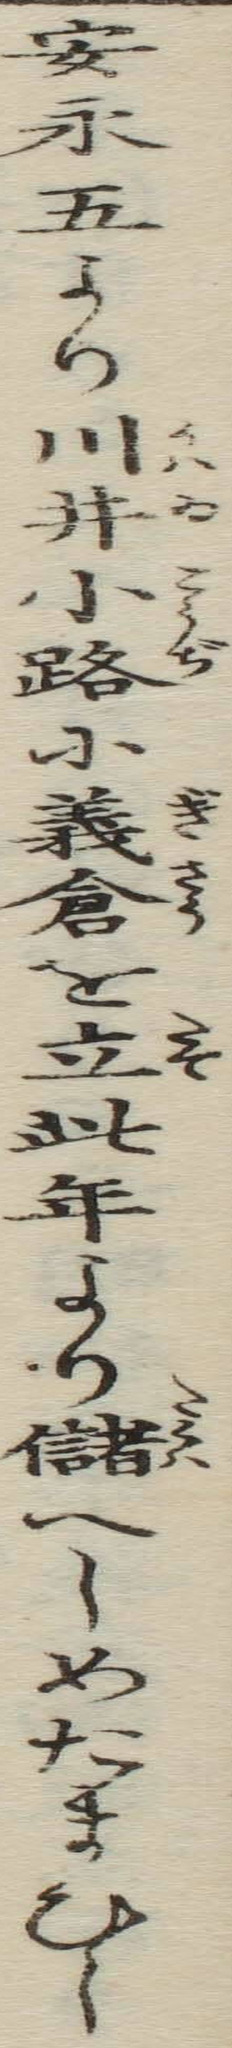安永五より川井小路に義倉を立此年より儲へしめたまひし
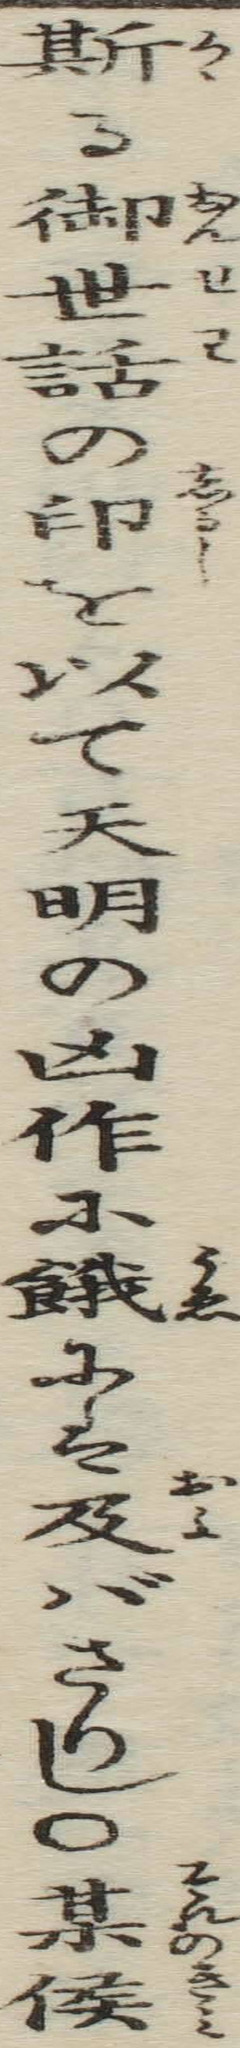斯る御世話の印を以て天明の凶作に餓には及ばさりし○某侯
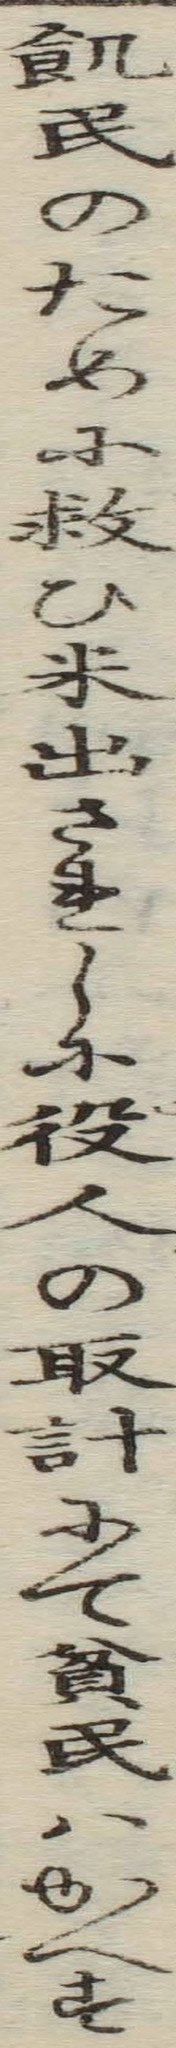飢民のために救ひ米出されしに役人の取計にて貧民はかへす
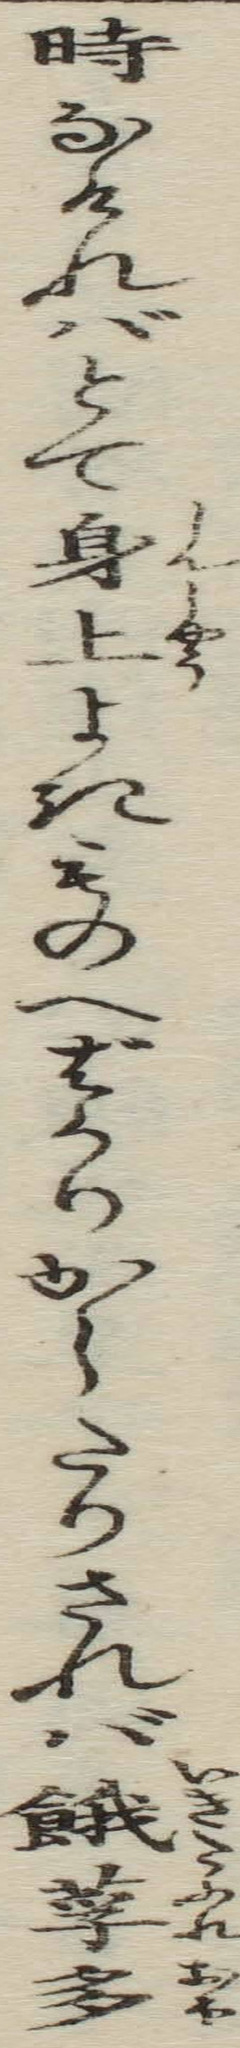時なければとて身上よきものへばかりかしたりされば餓莩多
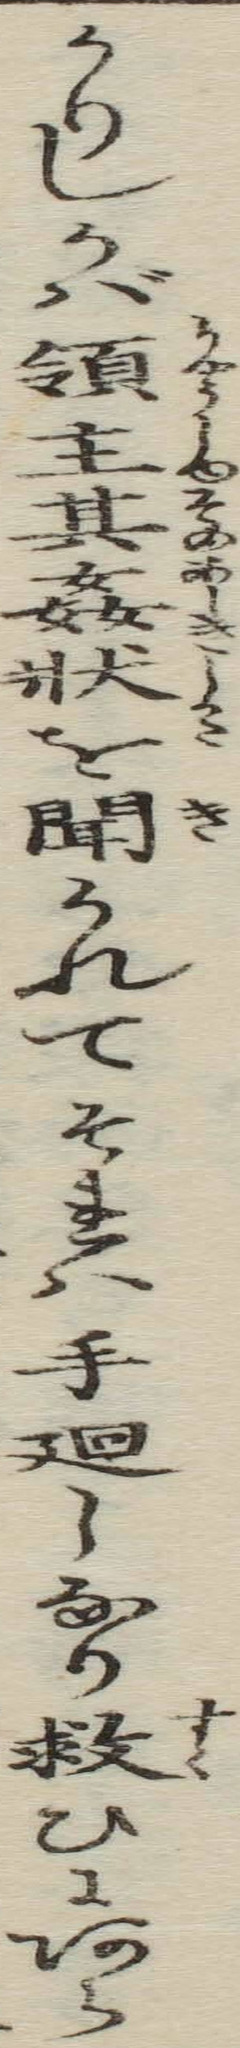かりしかば領主其姦状を聞かれてそれは手廻しなり救ひにあら
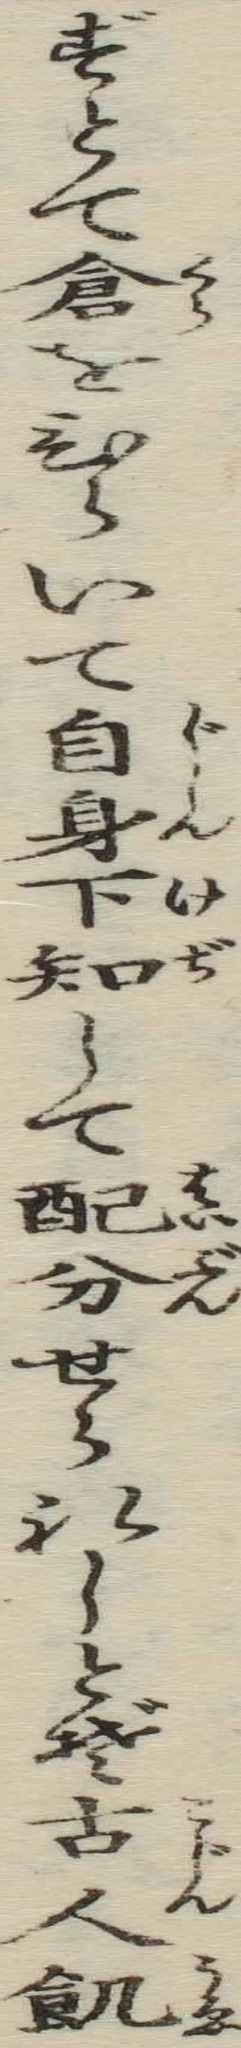ずとて倉をひらいて自身下知して配分せられしとぞ古人飢
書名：救荒便覧
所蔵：国文学研究資料館
